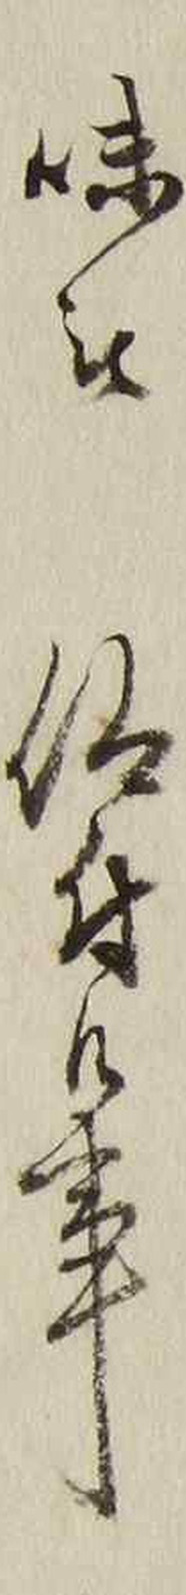味被仰付候事

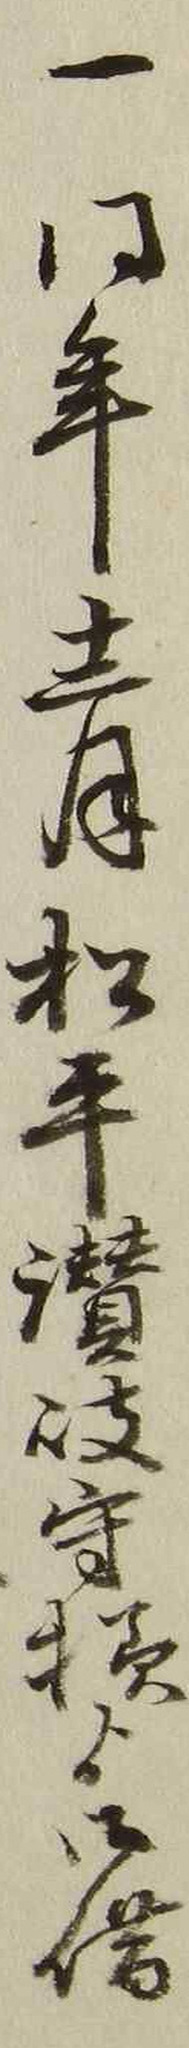一同年十二月松平讃岐守様ゟ御借
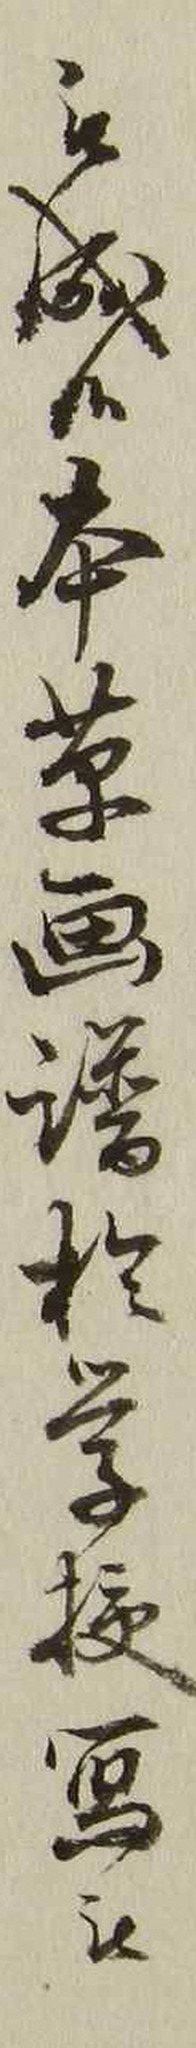被成候本草画譜於学校写被
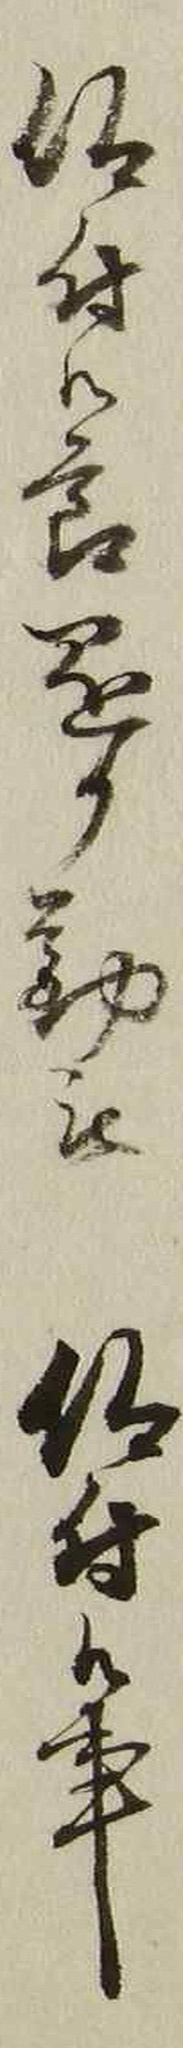仰付候節懸り勤被仰付候事
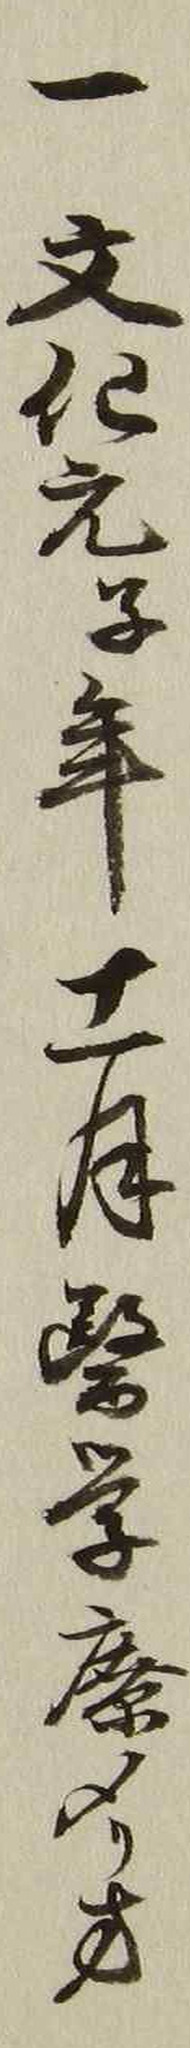一文化元子年十二月医学療〆り方
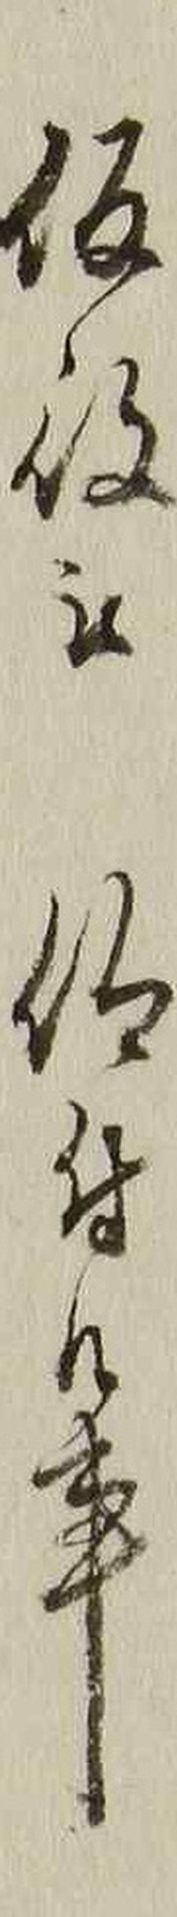仮役被仰付候事
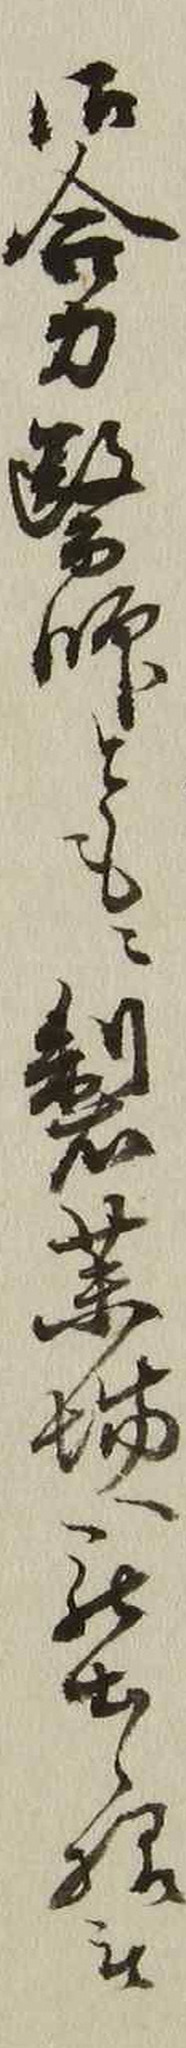御合力医師ともニ製薬場へ罷出候様被
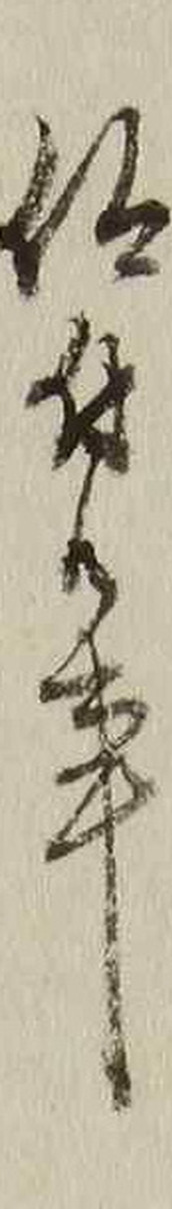仰付候事
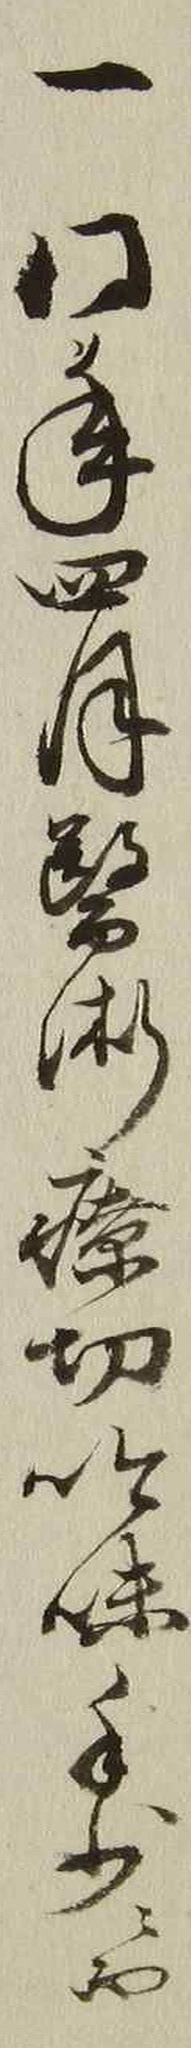一同年四月医術療功吟味手少ニ而
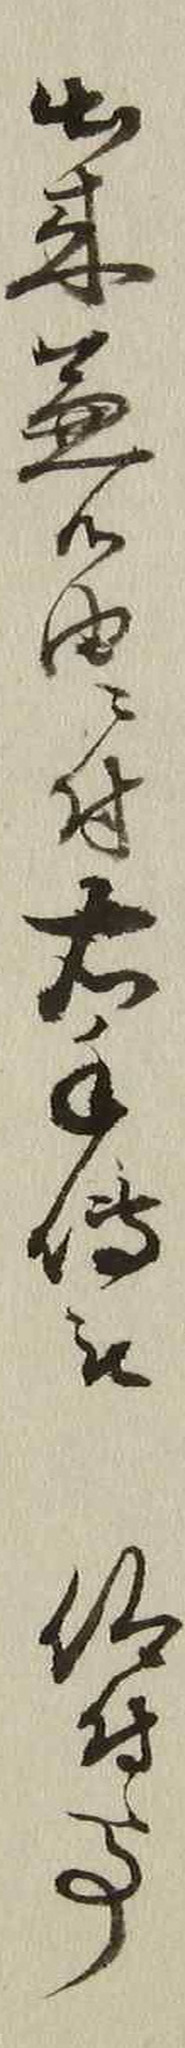出来兼候由ニ付右手伝被仰付候事
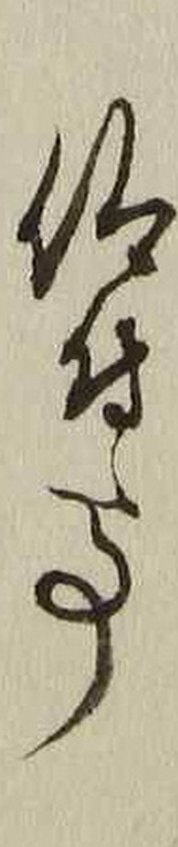仰付候事
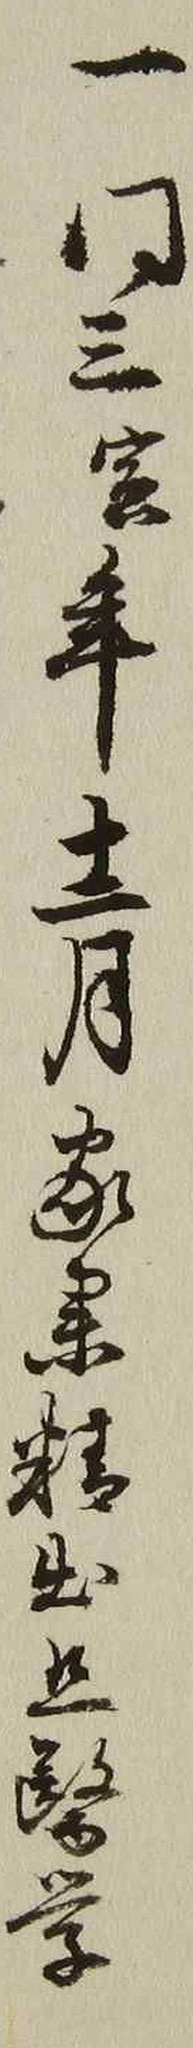一同三寅年十二月家業精出且医学
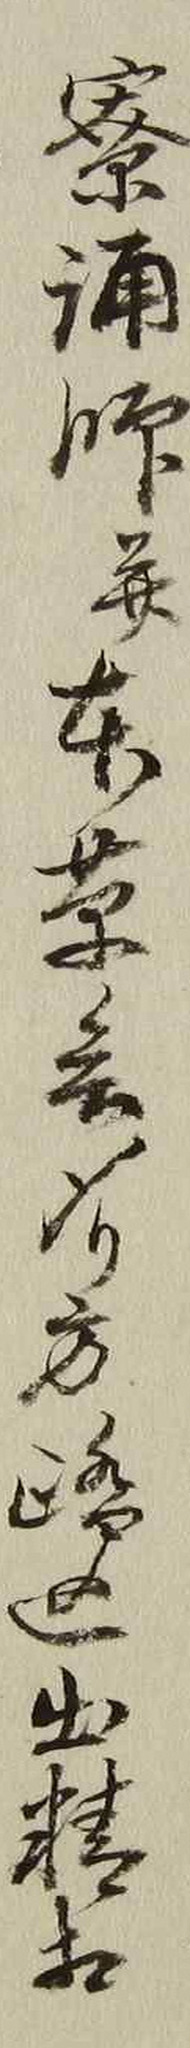寮誦師并本草会〆り方踏込出精相
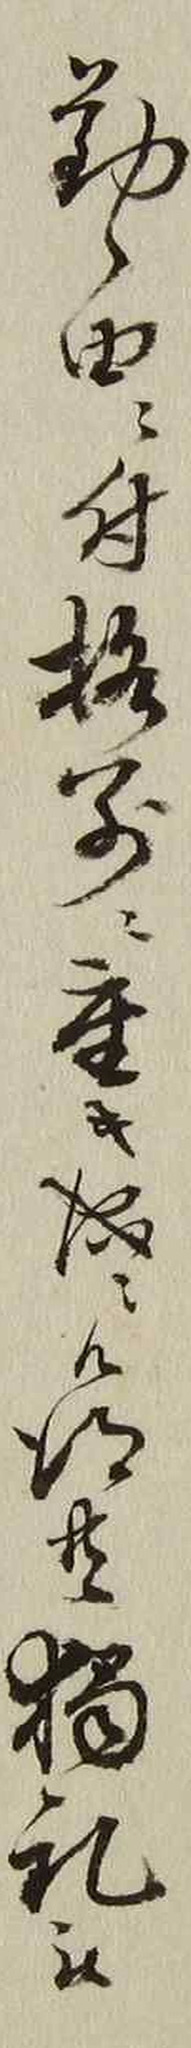勤候由ニ付格別重キ義ニ候得共独礼被
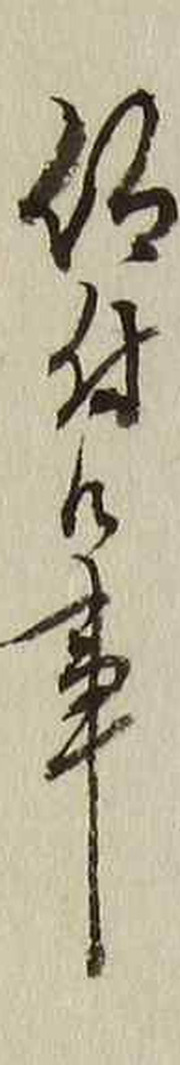仰付候事
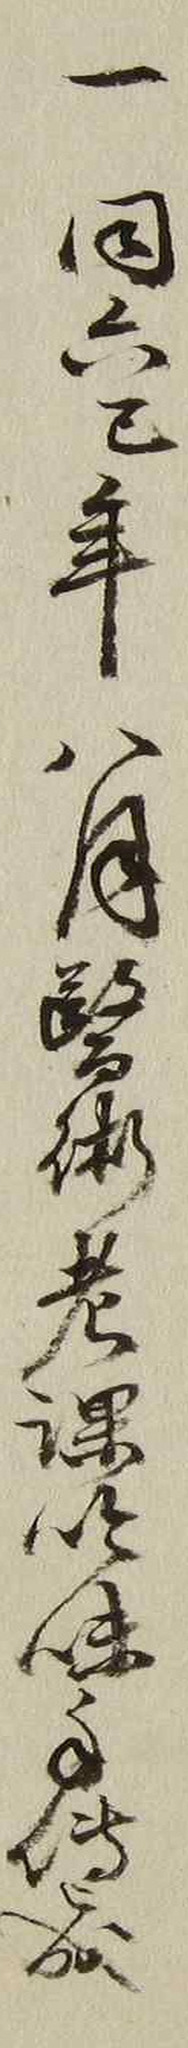一同六巳年八月医術考課吟味手伝被成
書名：諸士系譜　巻之39　は之部7
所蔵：会津若松市立会津図書館
